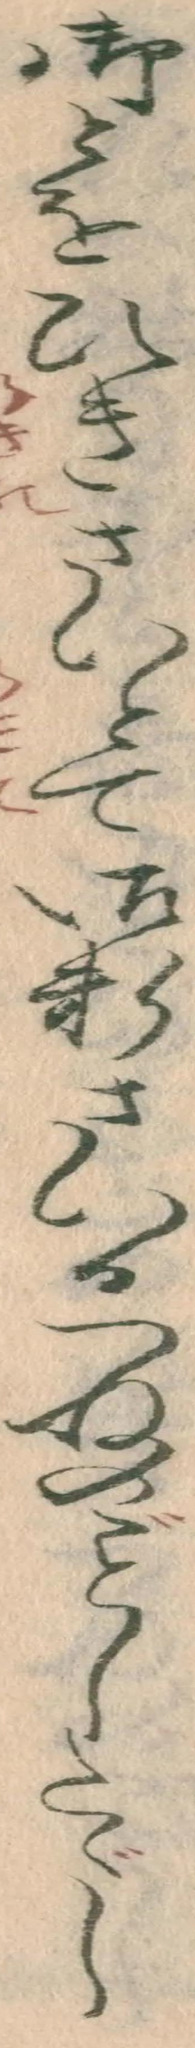御とをひきまいとて御料まいるつねのごとしたゞし
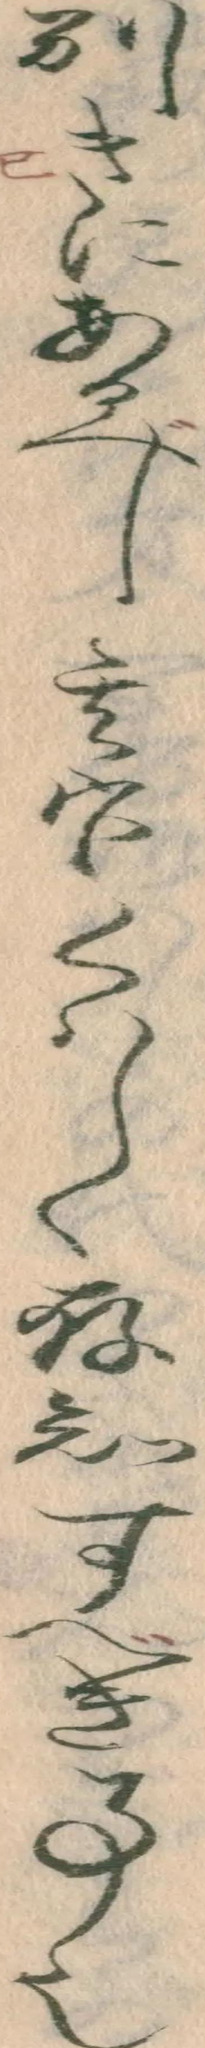別きにあるべし其官くはしく存知すべき事也
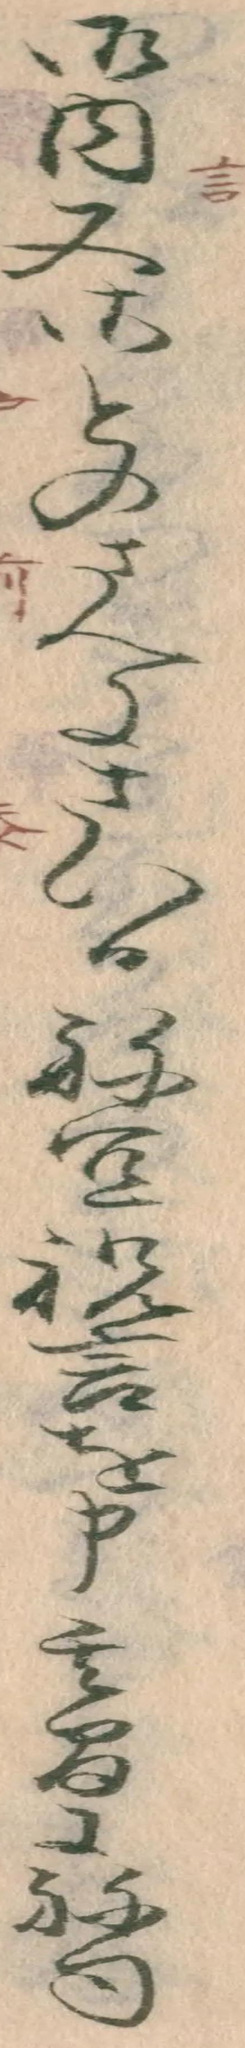御内又御とのまへにまいる祢宜祝言を申其間に祢司
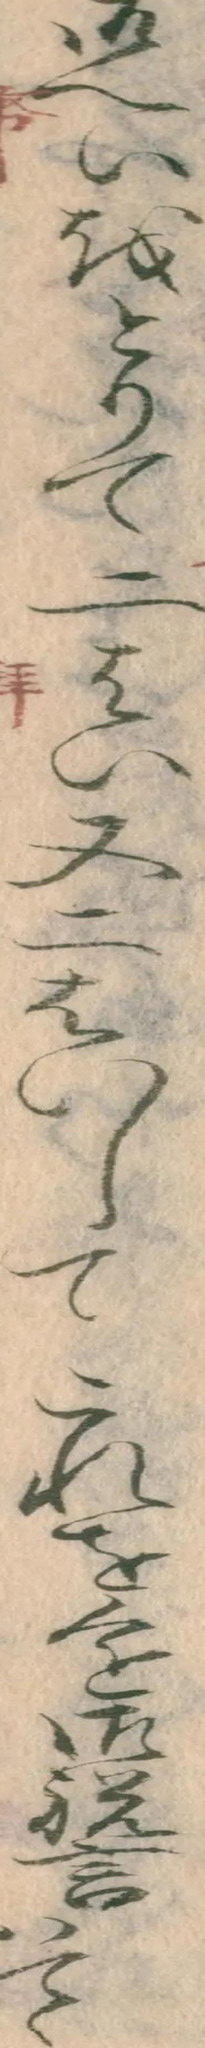御へいをとりて二はい又二はいしてこれを進御祝言はてゝ
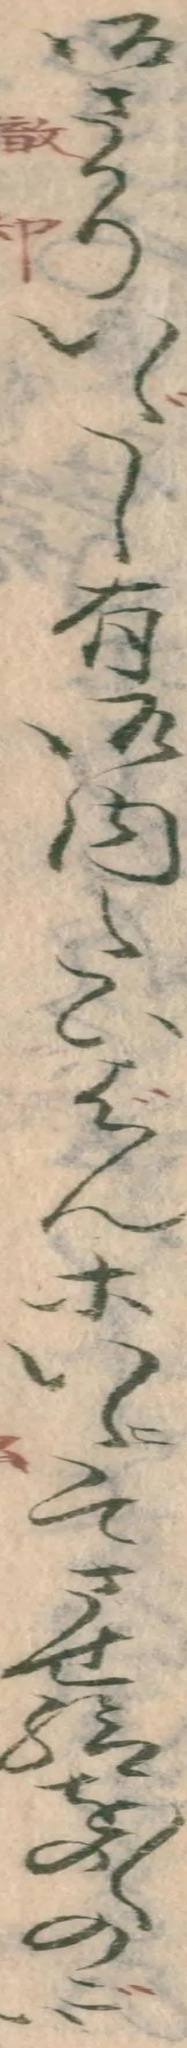御さかりいだし有御内たいばん等いだてさせ給をの〳〵のごい
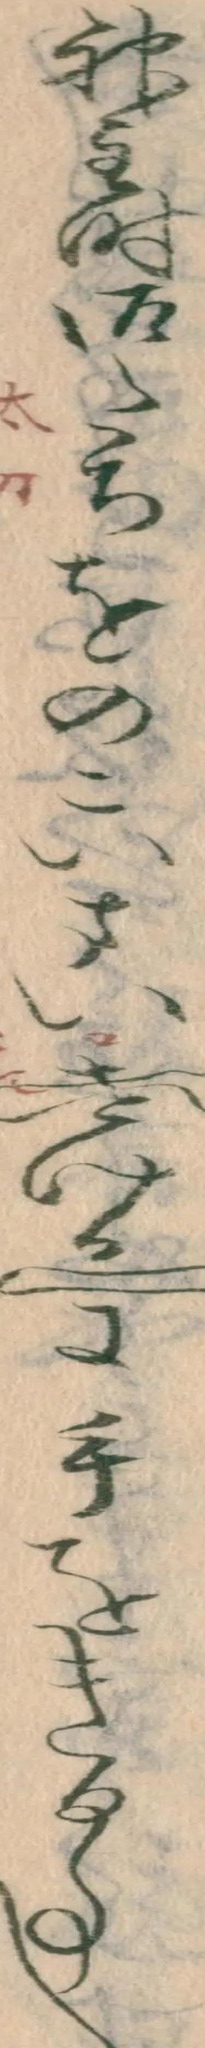神主時御たちをのこいまい◦せけるに手をきる事
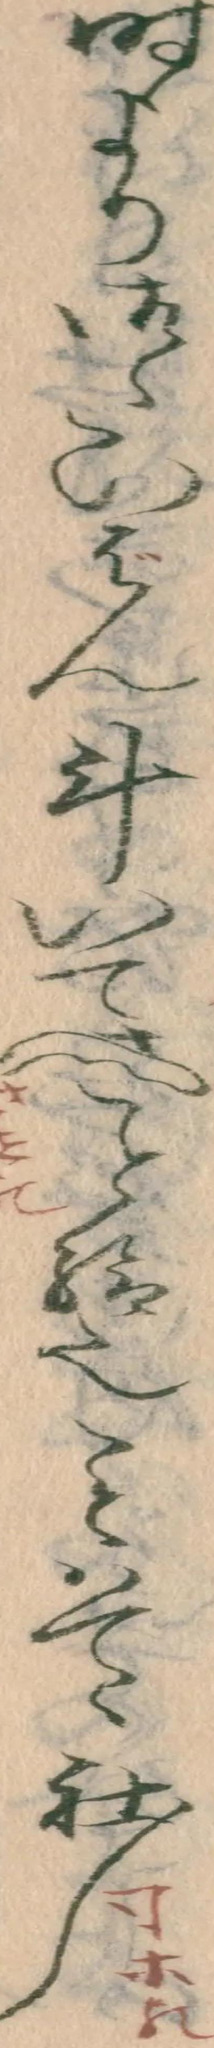時より御たいばん計いてと給也ことはてゝ社司等歟
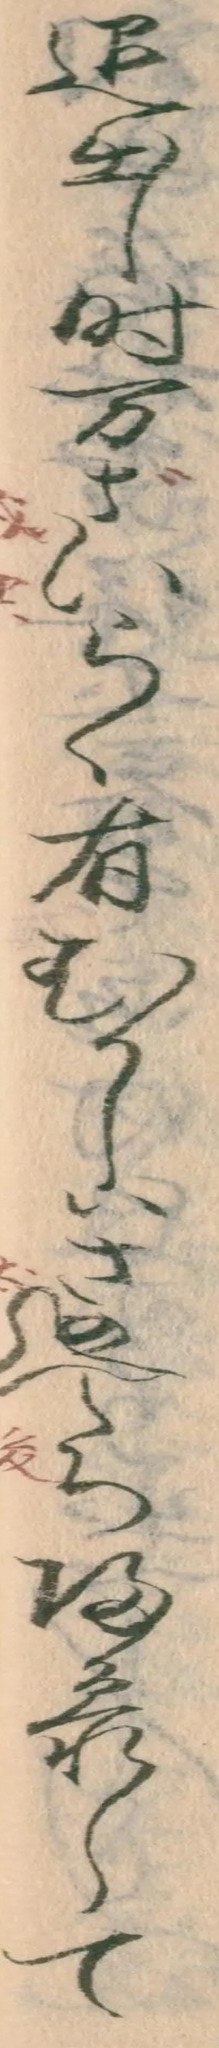退出し時万ざいらく有むかしはさのゝち帰参して
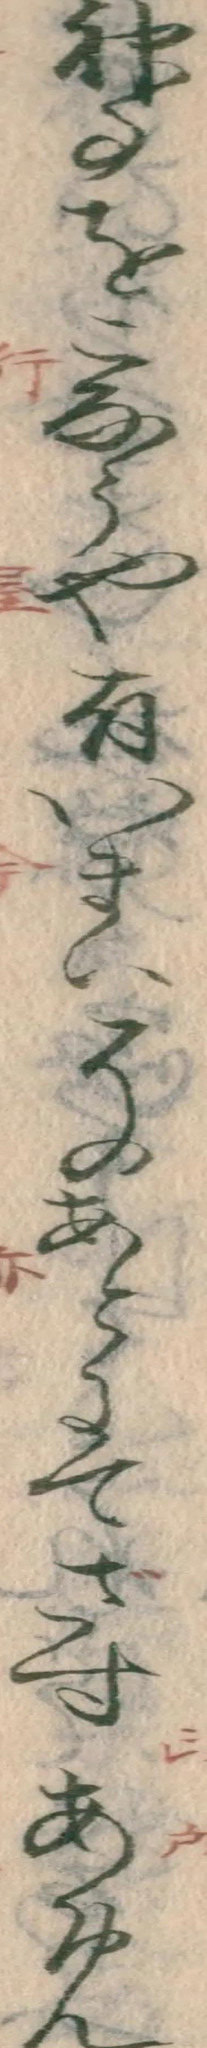神事をこなうや有いまいそのあとにてざすあめ
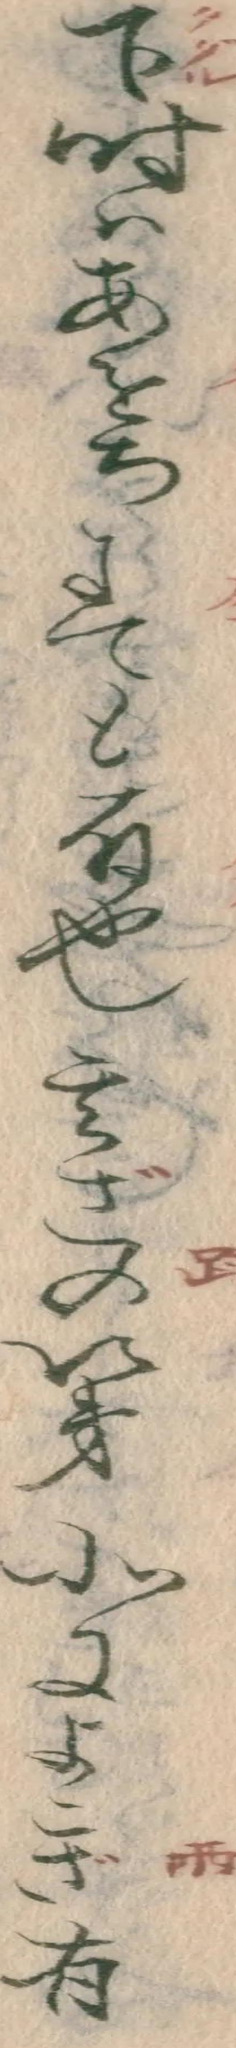下時はあをちにても有也其ざの次第北によこざ有
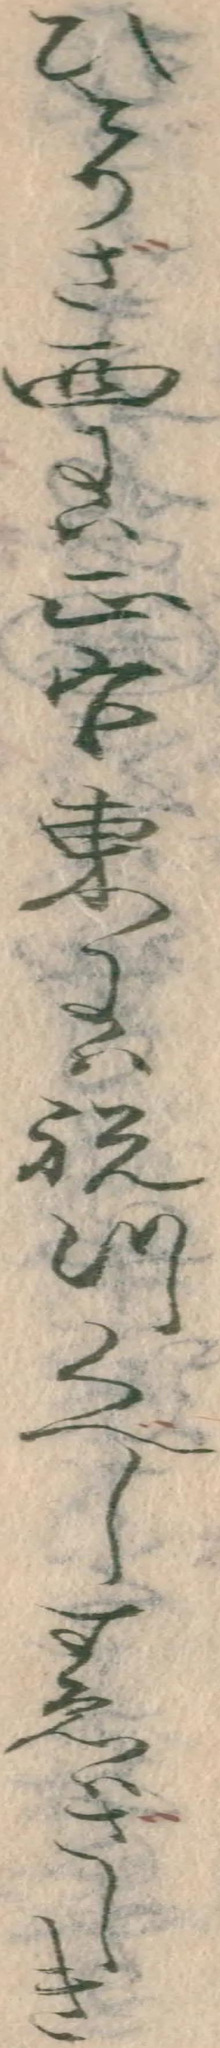ひとりざ西には正官東には祝つくべしすゑはざしき
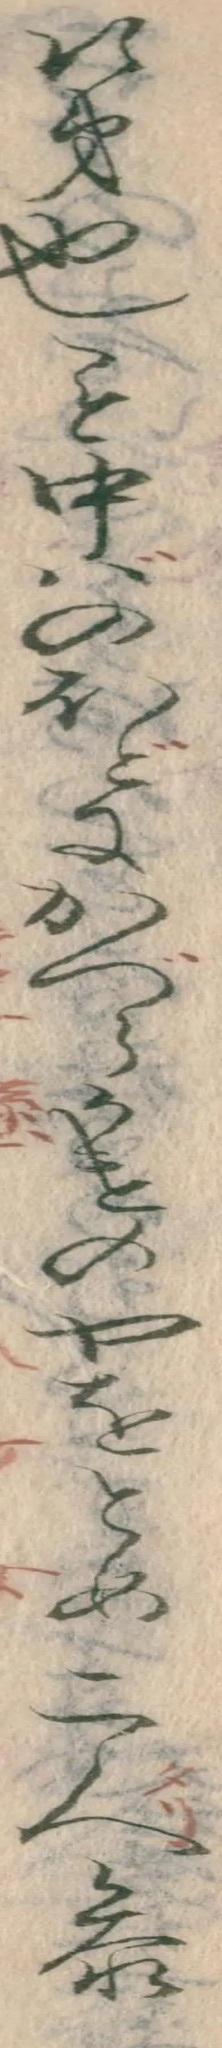次第也こと中ばのほどにかづらかけのやをとめ二人参
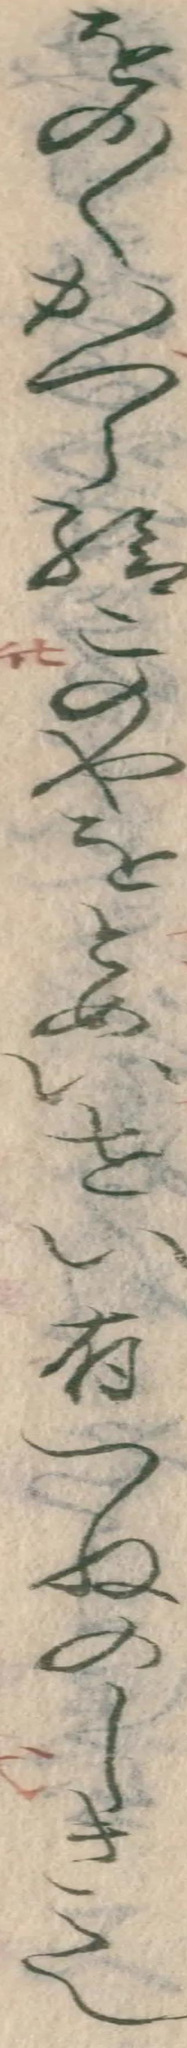をの〳〵かづら給このやをとめいせい有つねのしき也
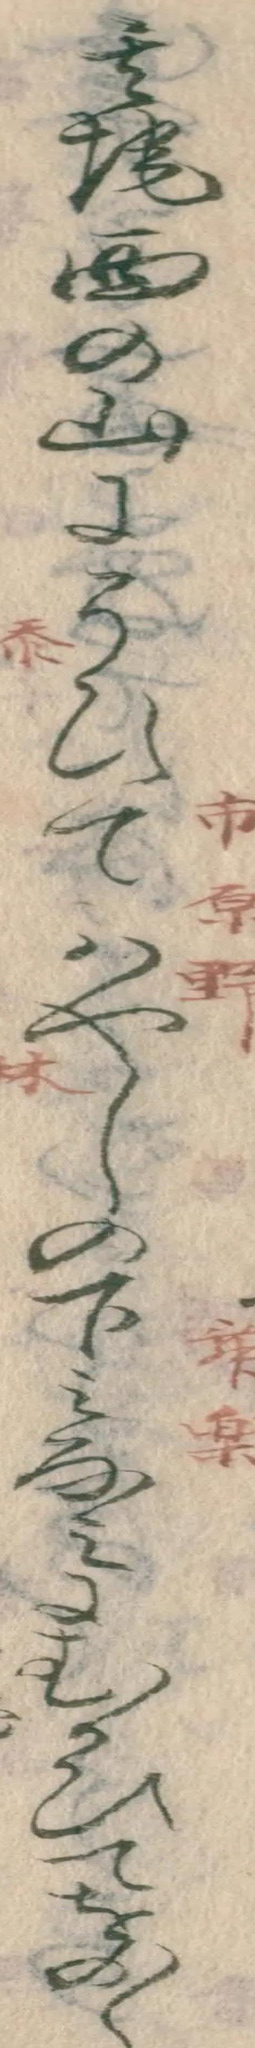其地西の山にそひてはやしの下みなみにむかひてをの〳〵
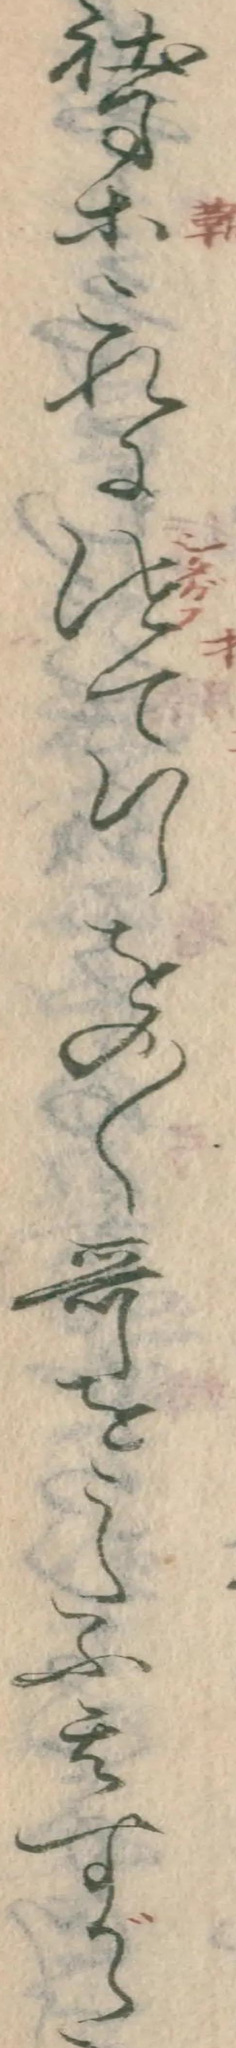社司等これに随て行をの〳〵哥をうたふ其すがた

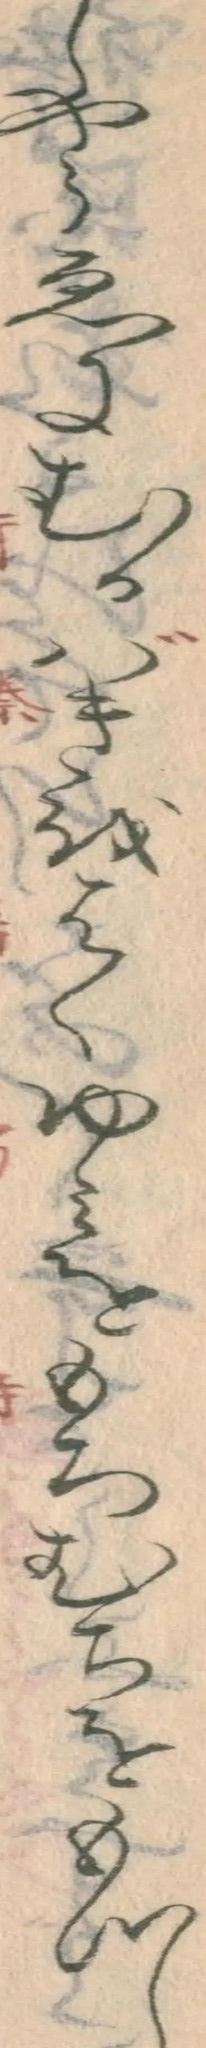しやうゑにむかばきをはくゆみをもちむちをもつ
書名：賀茂社記録. 第3冊
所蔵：国立国会図書館 National Diet Library, JAPAN
